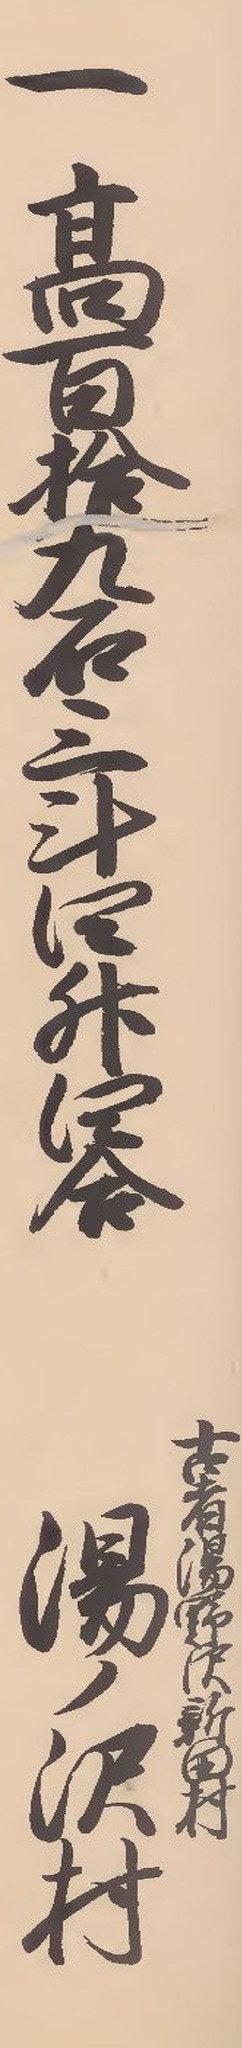一高百拾九石三斗四升四合湯ノ沢村
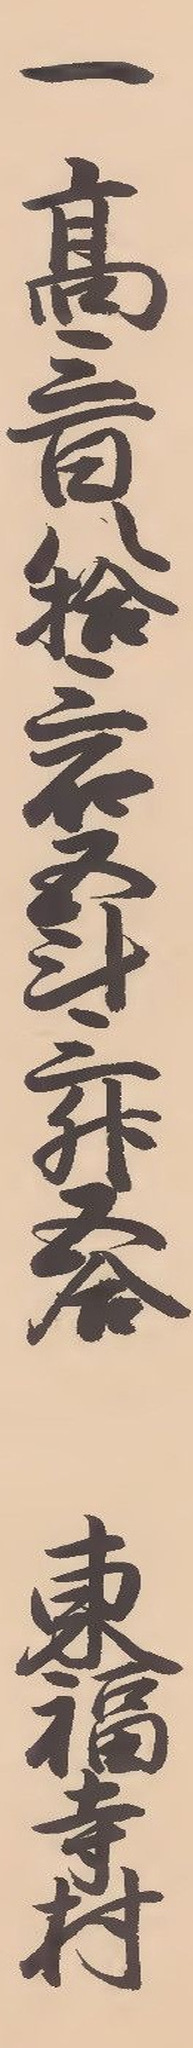一高三百八拾三石五斗三升五合東福寺村
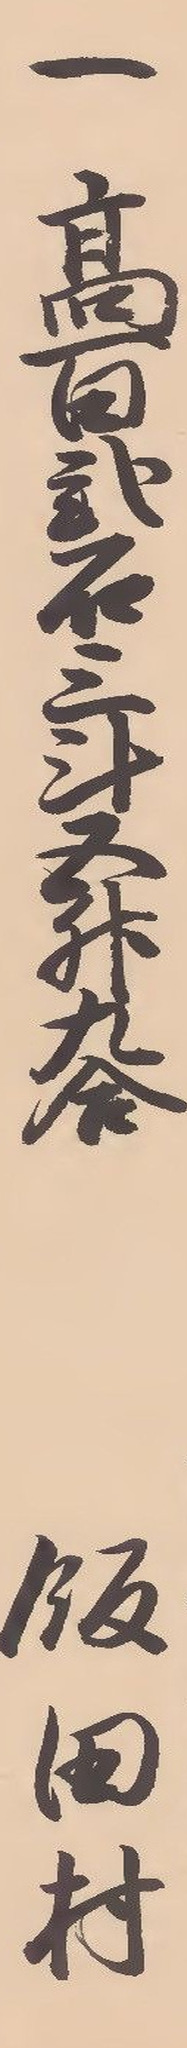一高百弐石三斗五升九合飯田村
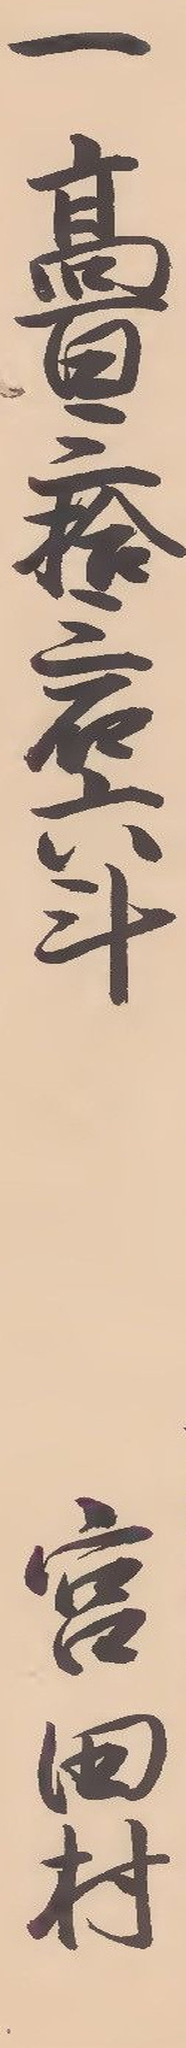一高百三拾三石六斗宮田村

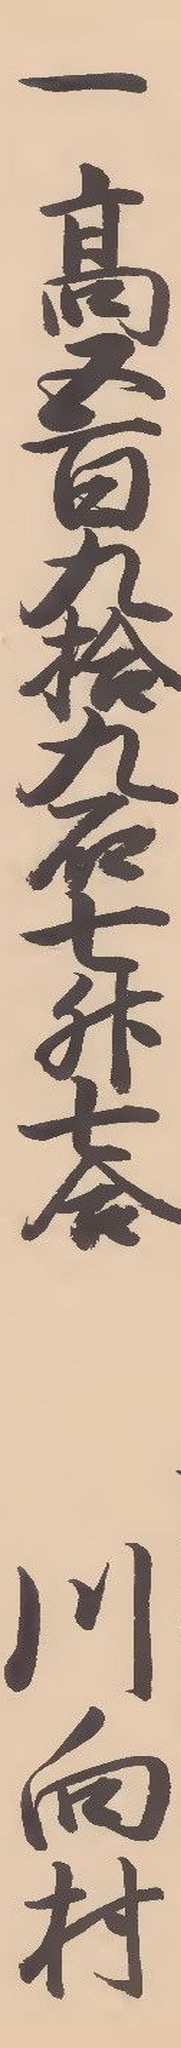一高五百九拾九石七升七合川向村
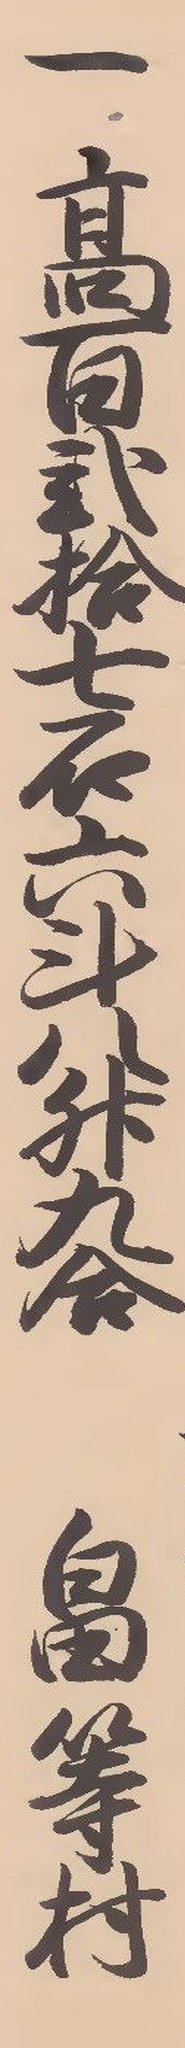一高百弐拾七石六斗八升九合畠等村
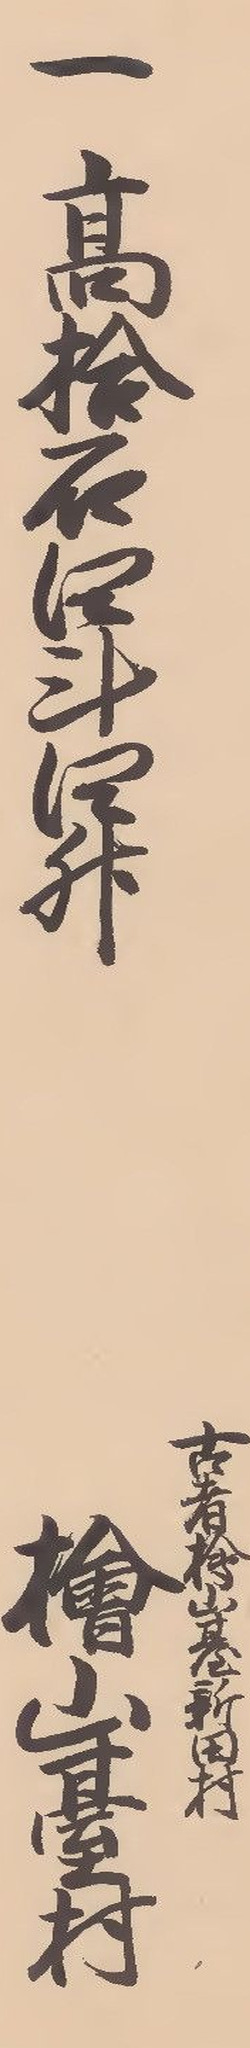一高拾石四斗四升桧山台村
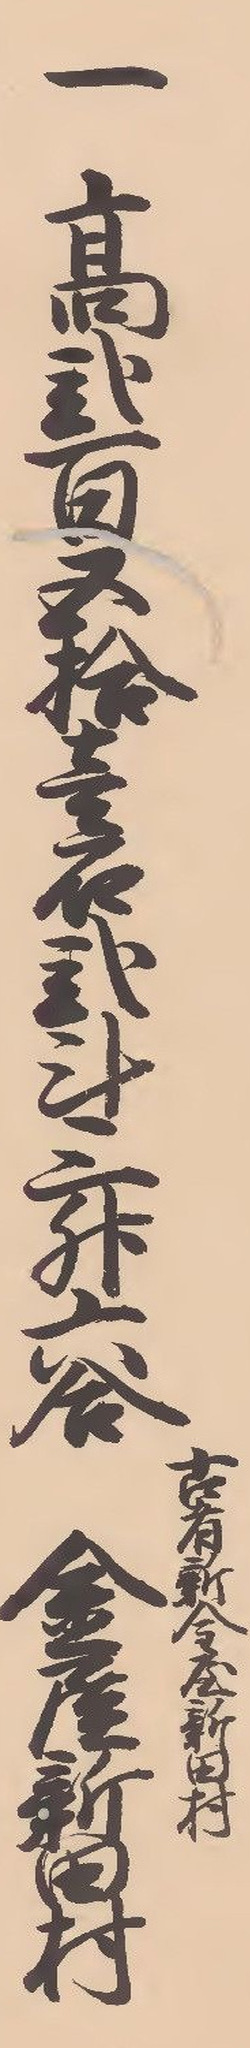一高弐百五拾壱石弐斗三升六合金屋新田村
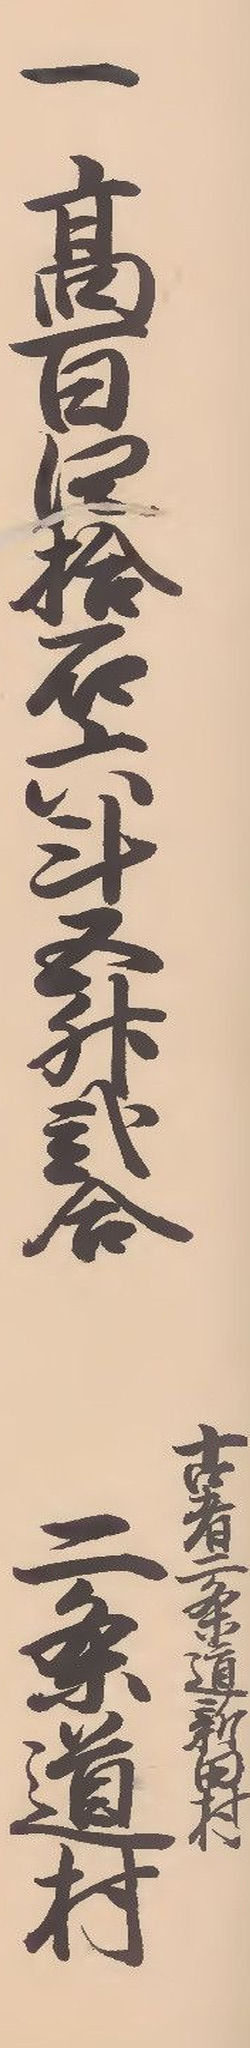一高百四拾石六斗五升弐合二条道村
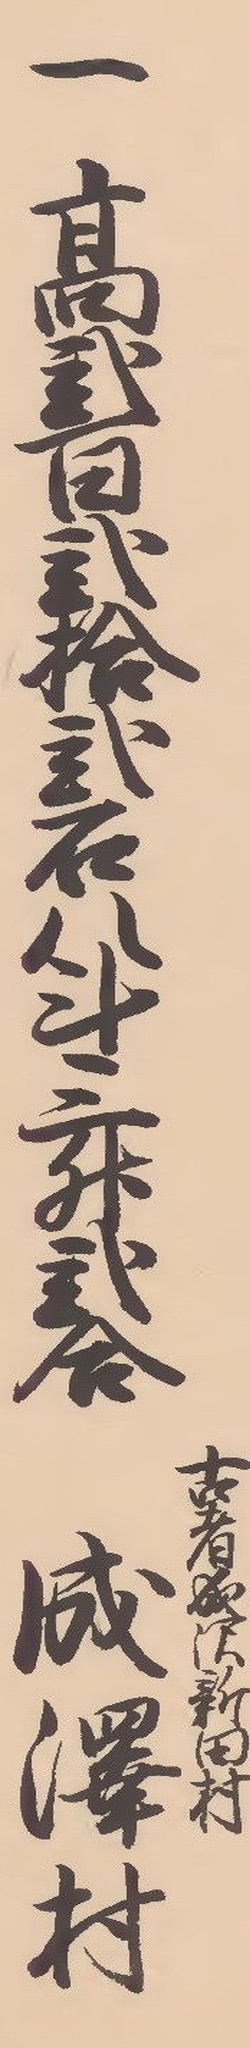一高弐百弐拾弐石八斗三升弐合成沢村
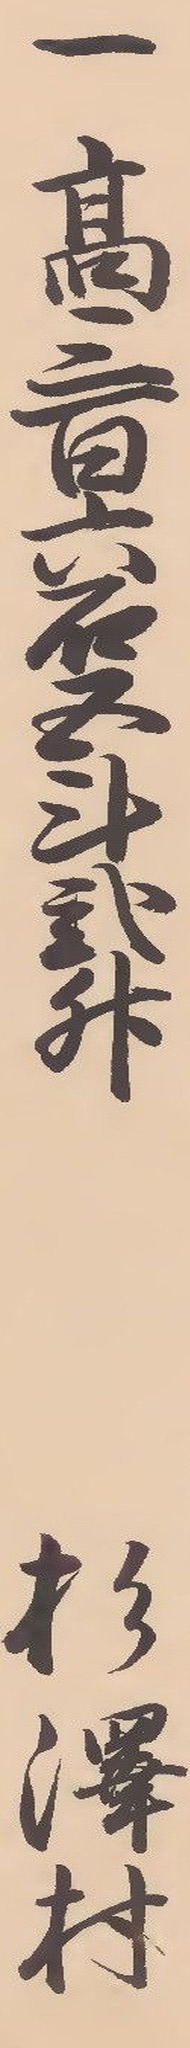一高三百六石五斗弐升杉沢村

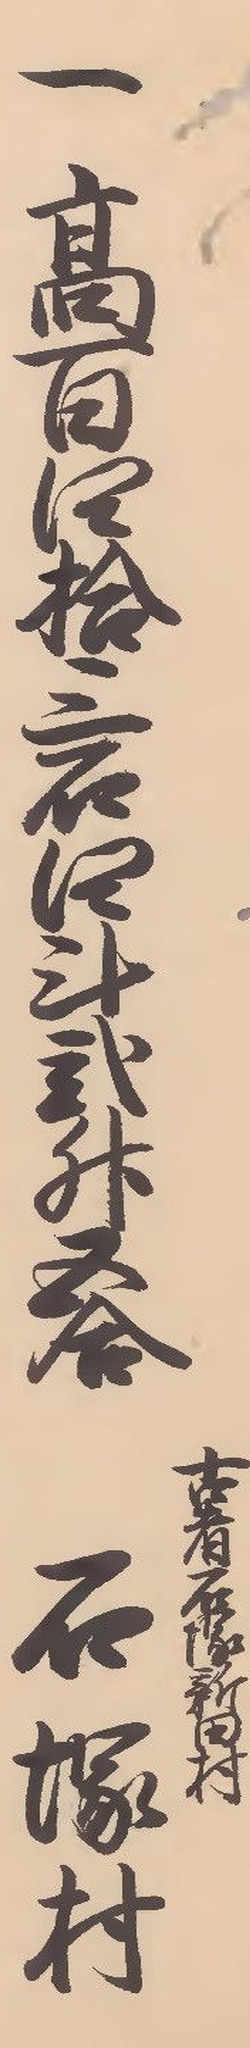一高百四拾三石四斗弐升五合石塚村
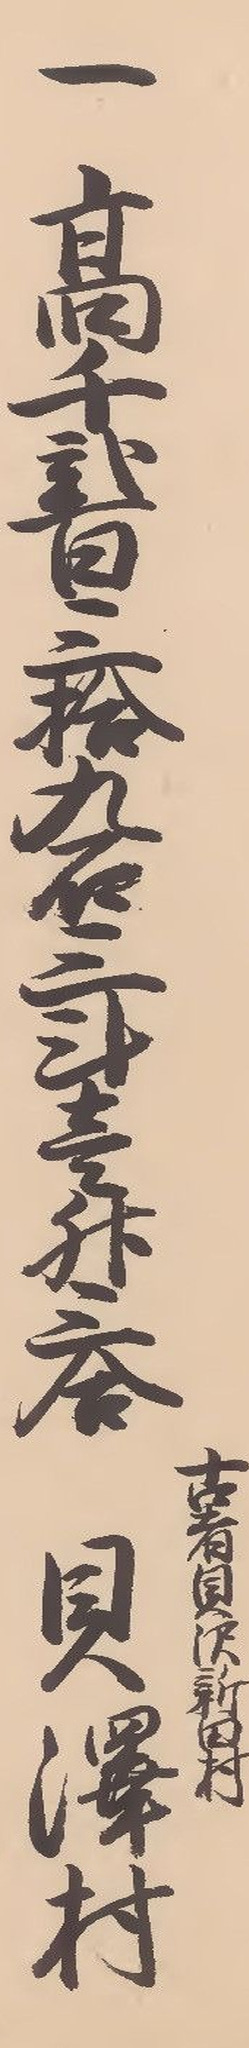一高千弐百三拾九石三斗壱升三合貝沢村
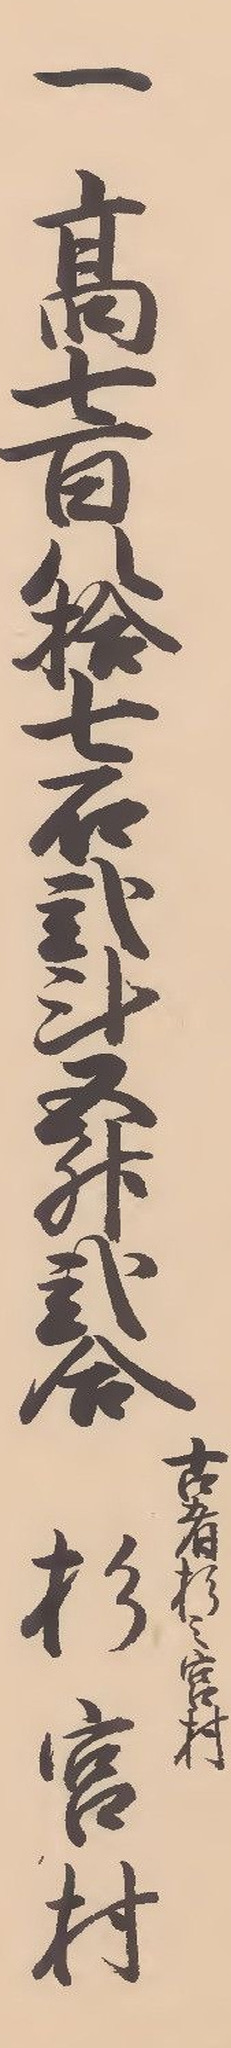一高七百八拾七石弐斗五升弐合杉宮村
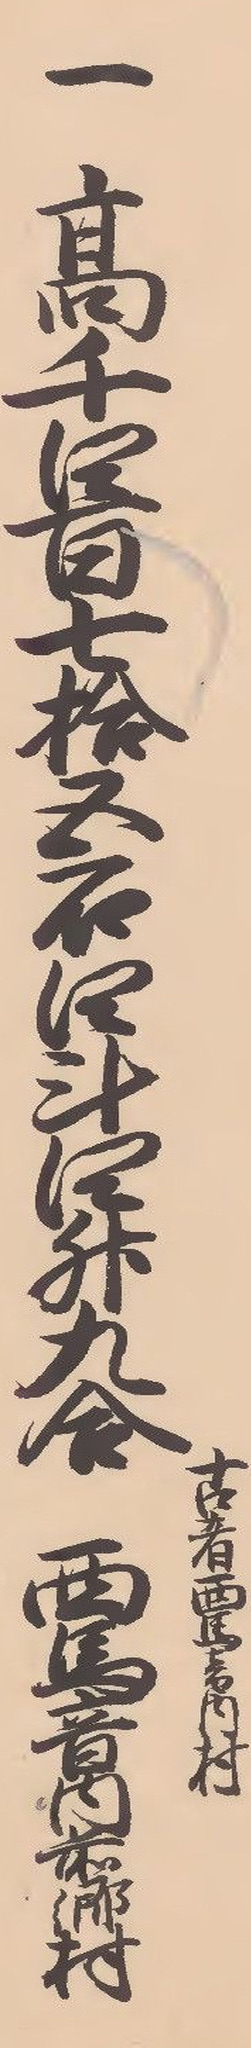一高千四百七拾五石四斗四升九合西馬音内前郷村
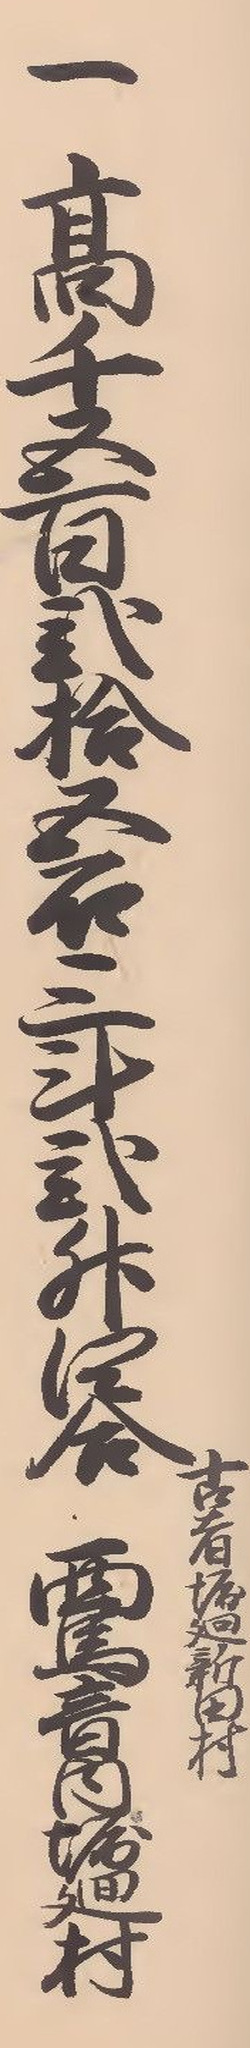一高千五百弐拾五石三斗弐升四合西馬音内堀廻村
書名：出羽国郷帳　５
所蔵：国立公文書館 National Archives of Japan
